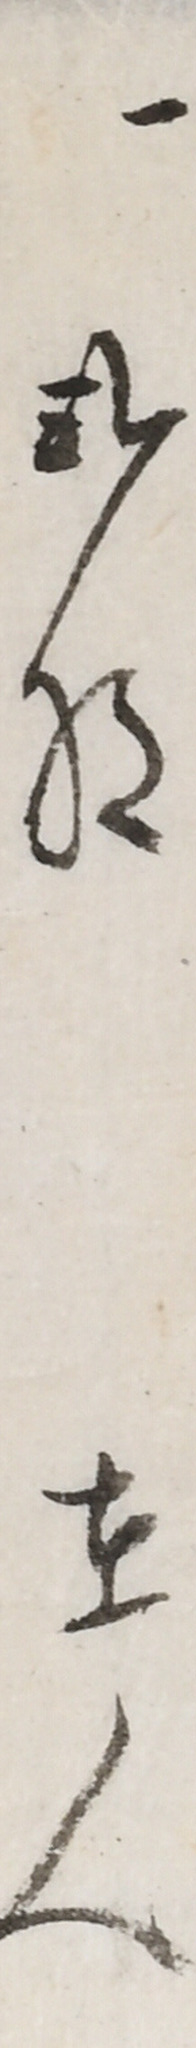一弐枚在人
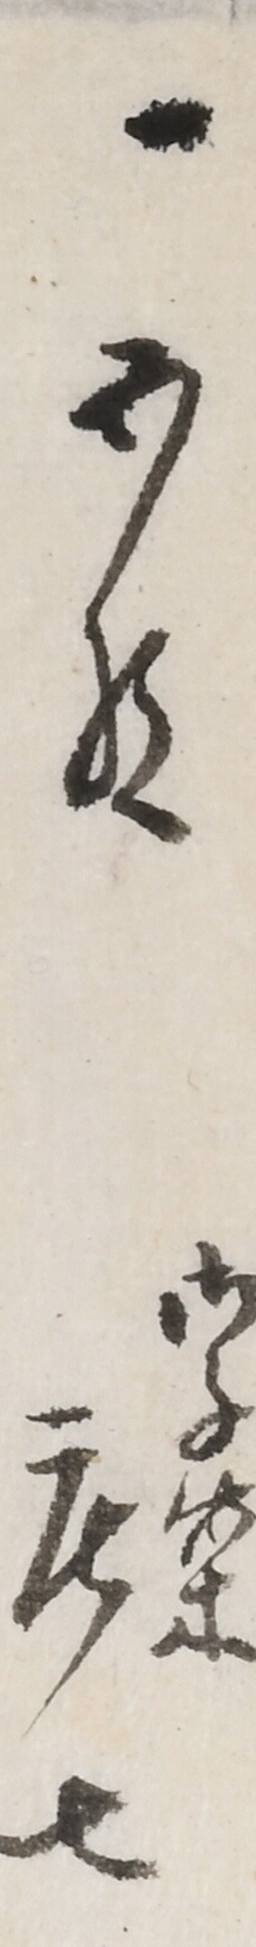一五枚庄七
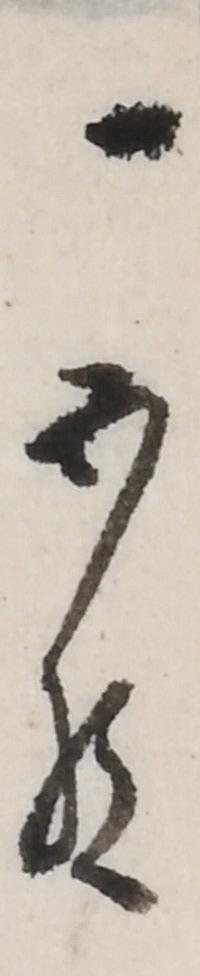一三枚
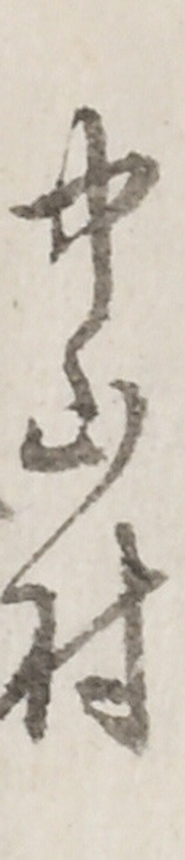中山村
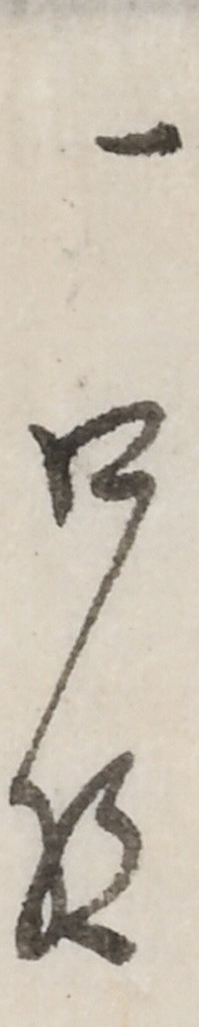一三枚
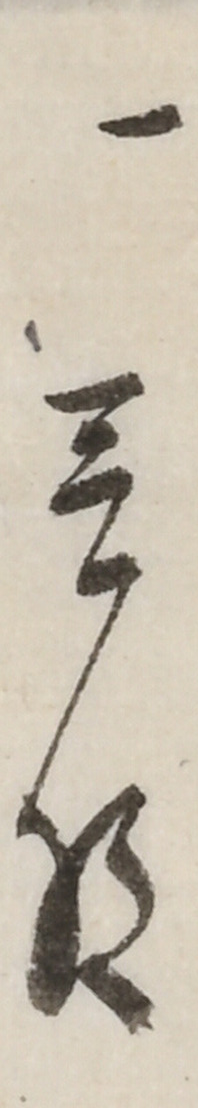一三枚
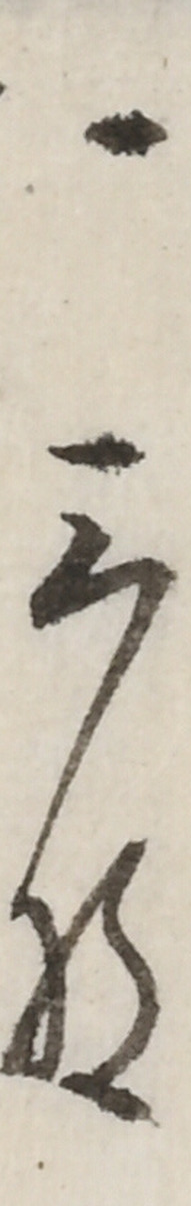一三枚
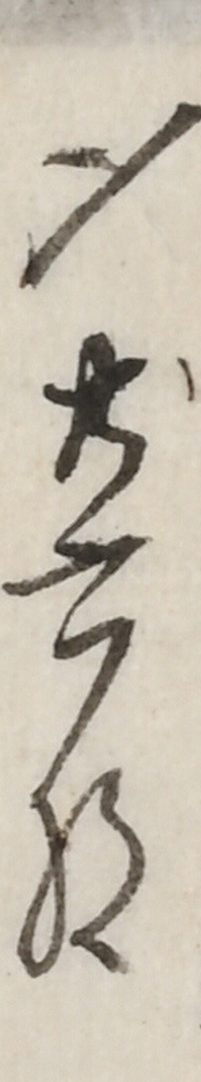〆廿六枚
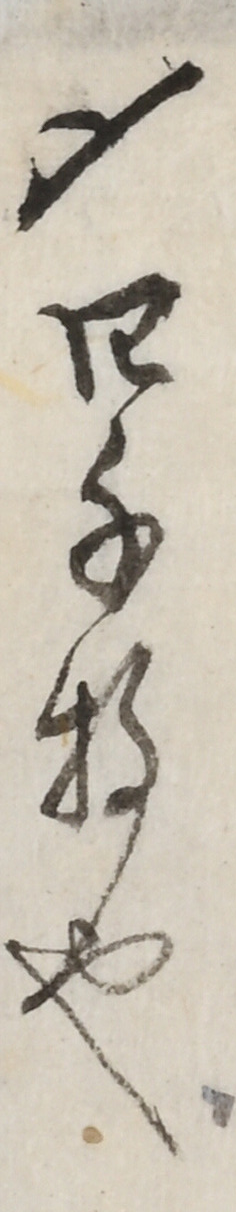〆四千枚也

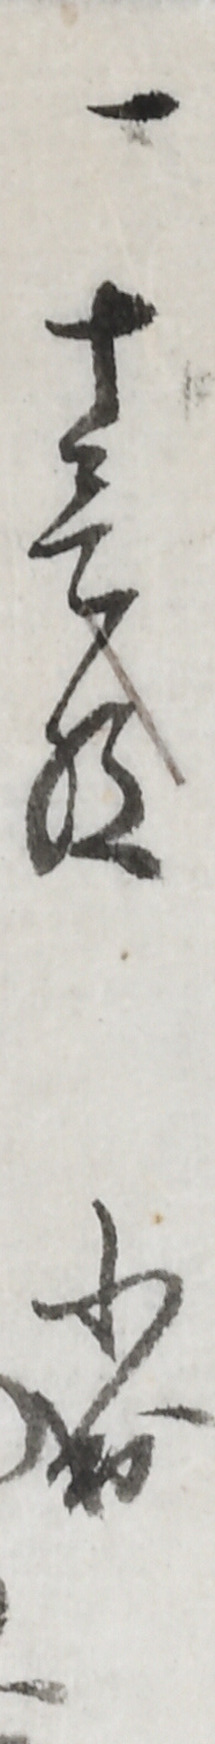一十壱枚八郎
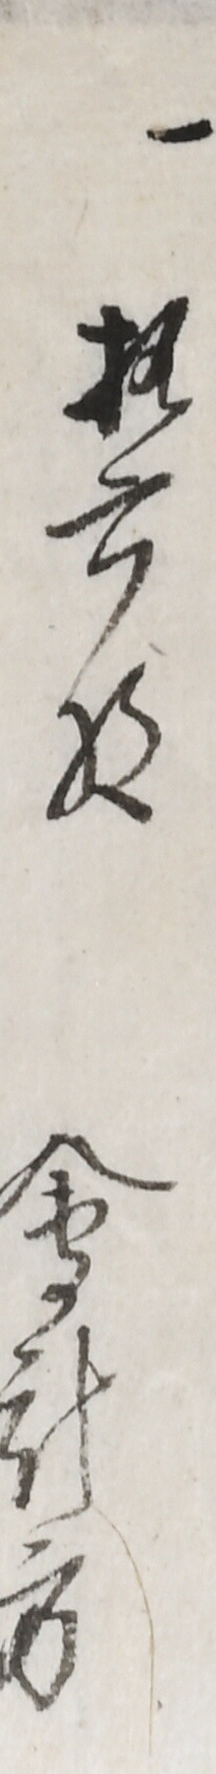一拾六枚会計方
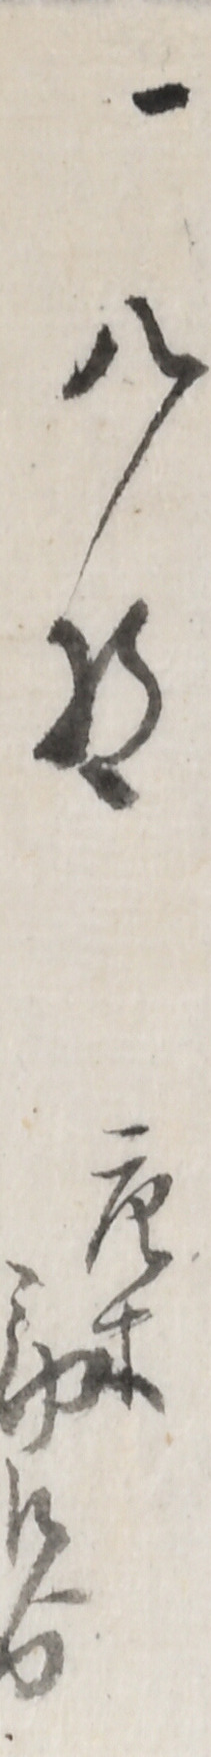一八枚杢左衛門
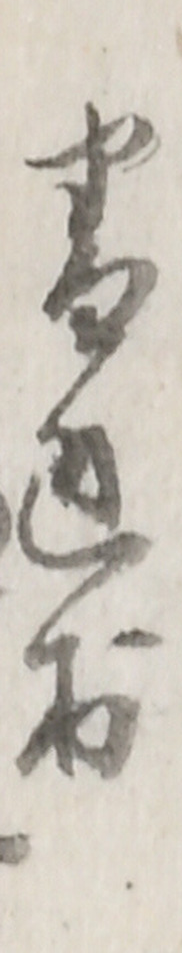番匠村
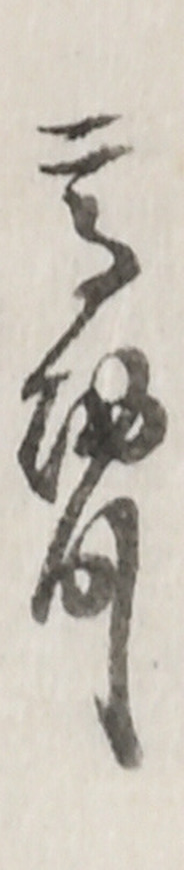高砂町
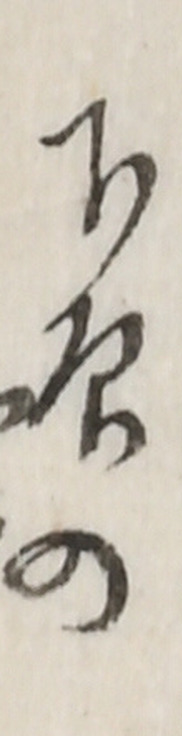下原の
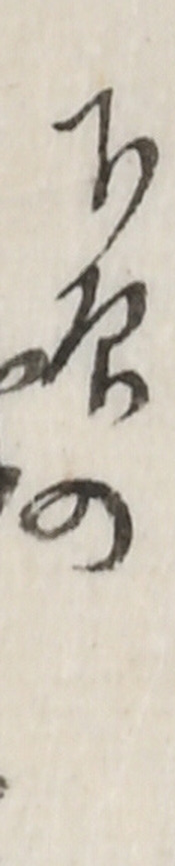下原の
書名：髙遠限楮幣引換覚帳
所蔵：伊那市立高遠町図書館・合同会社AMANE
